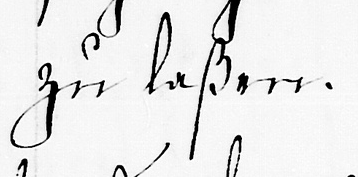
zu laßen.
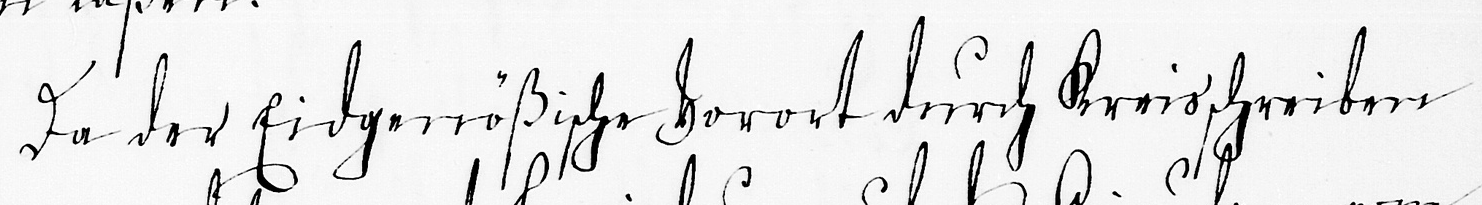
Da der Eidgenößische Vorort durch Kreisschreiben
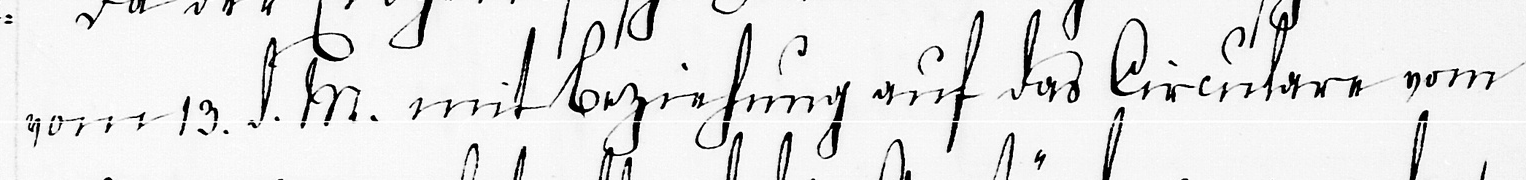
vom 13. d. M. mit Beziehung auf das Circulare vom
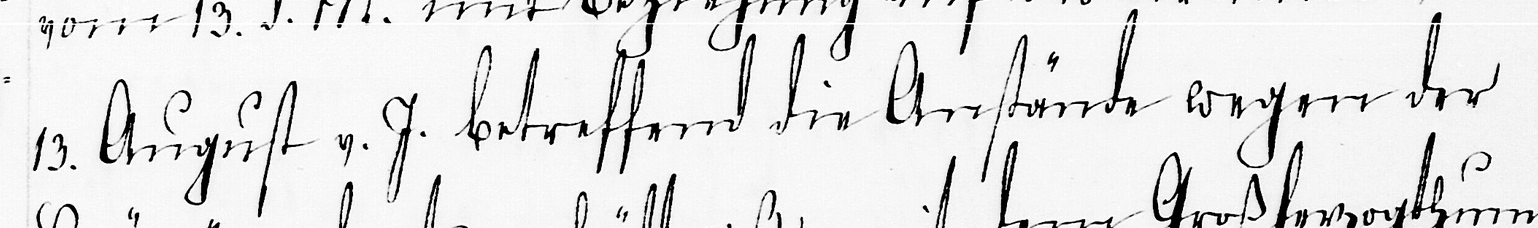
13. August v. J. betreffend die Anstände wegen der
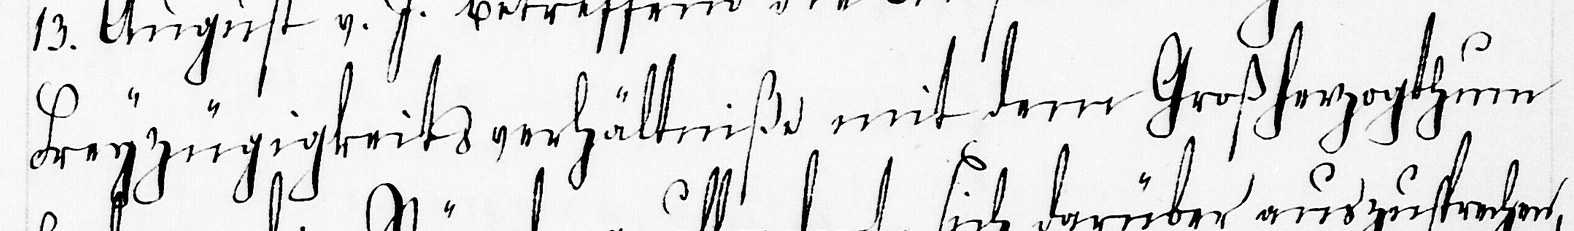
Freyzügigkeitsverhältniße mit dem Großherzogthum
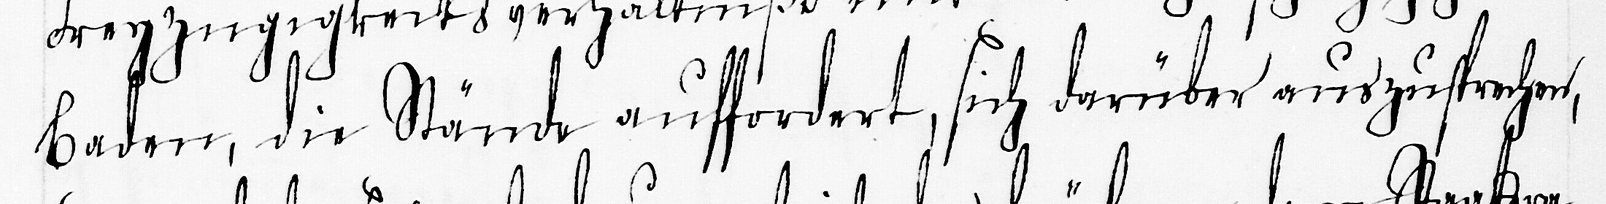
Baden, die Stände auffordert, sich darüber auszusprechen,
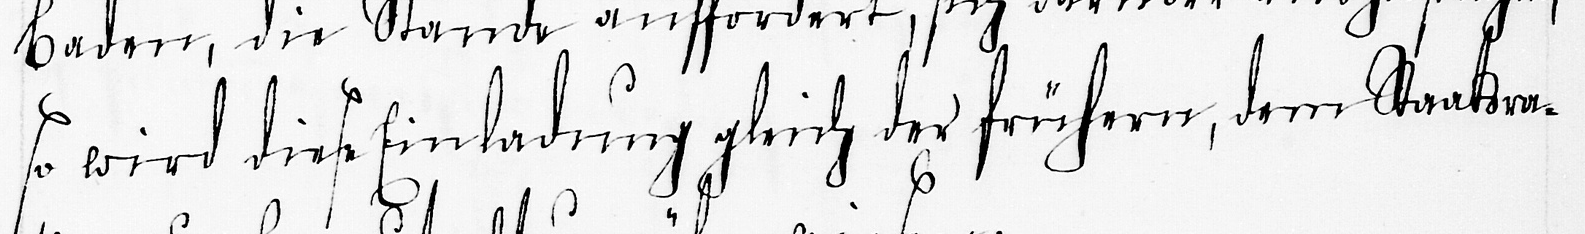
so wird diese Einladung gleich der frühern, dem Staatsra¬
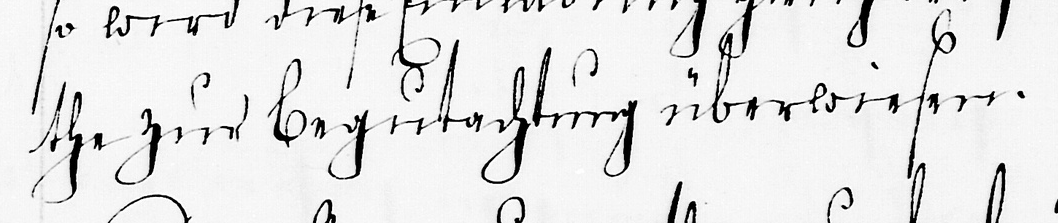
the zur Begutachtung überwiesen.
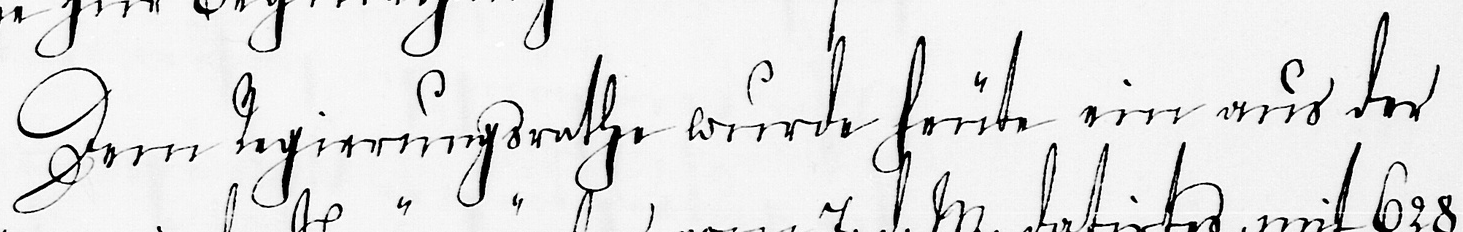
Dem Regierungsrathe wurde heute ein aus der
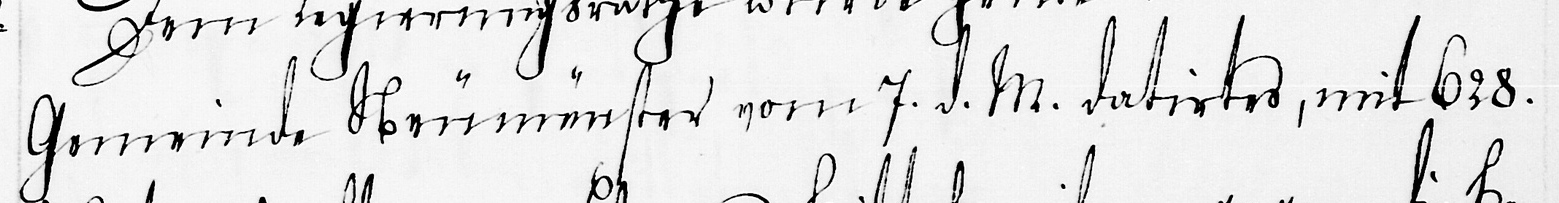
Gemeinde Neumünster vom 7. d. M. datirtes, mit 628.
